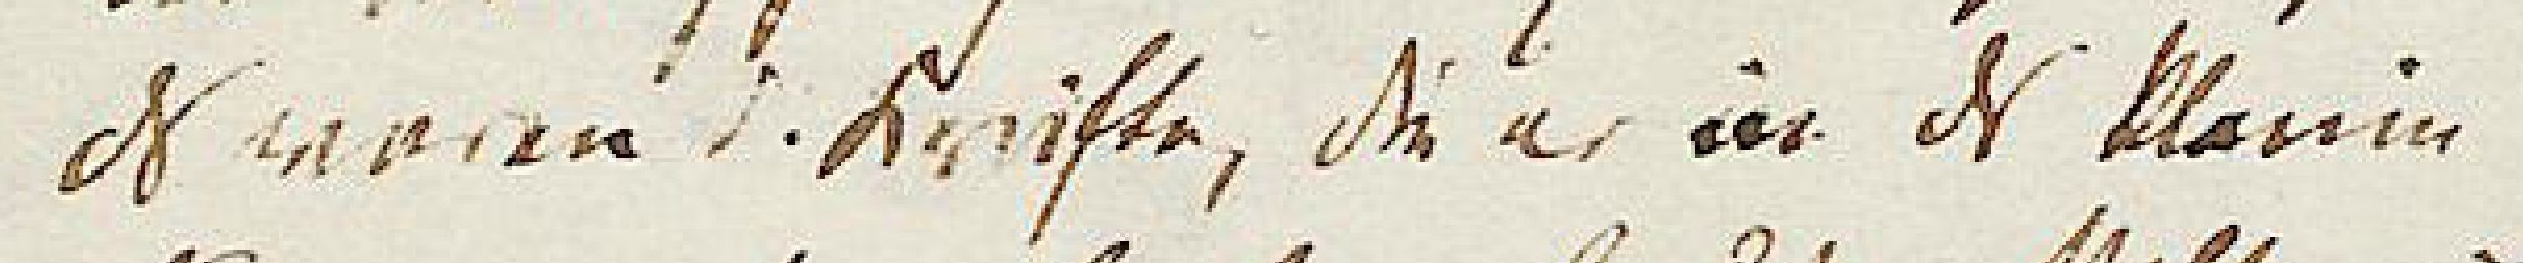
ds waren d. Kräfte, die er ein ds kleine
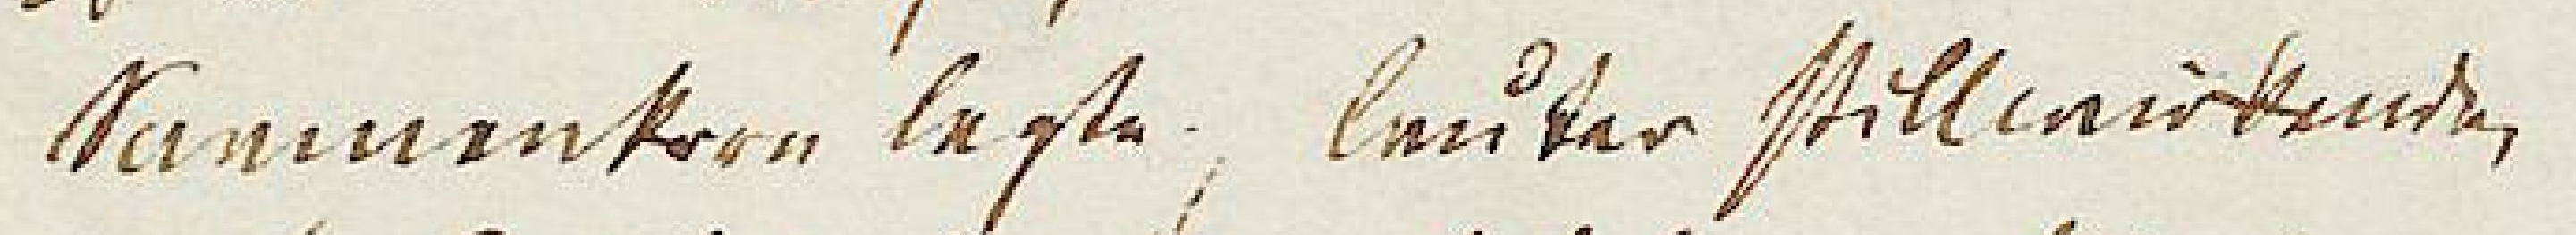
Samenkorn legt, lauter stillwirkende,
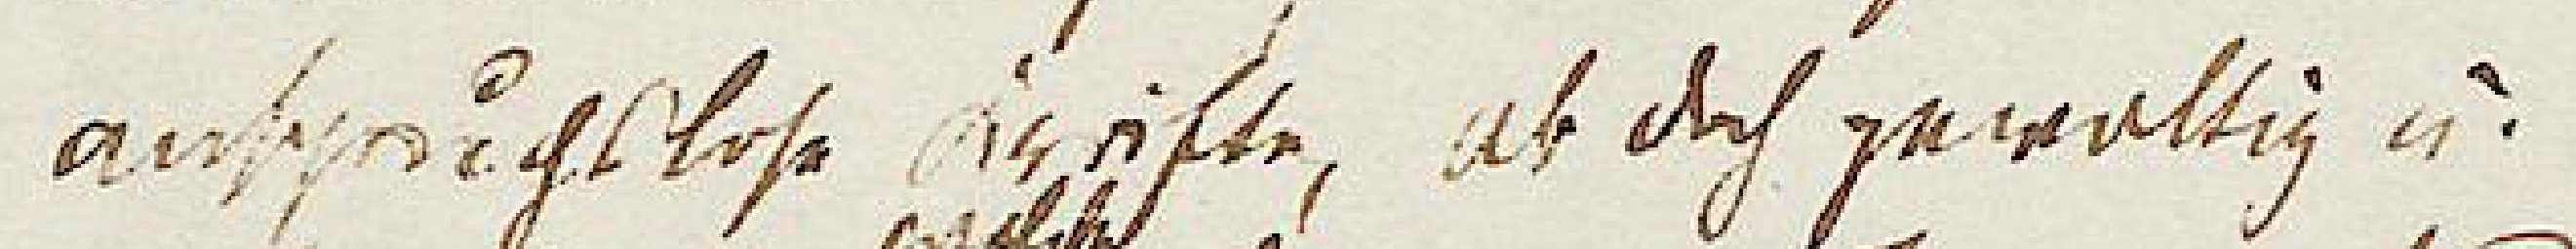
anspruchslose Kräfte, ob doch gewaltig u.
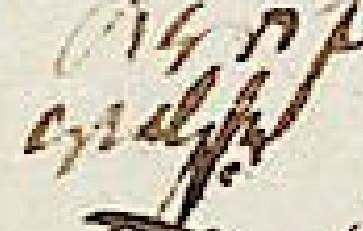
welche
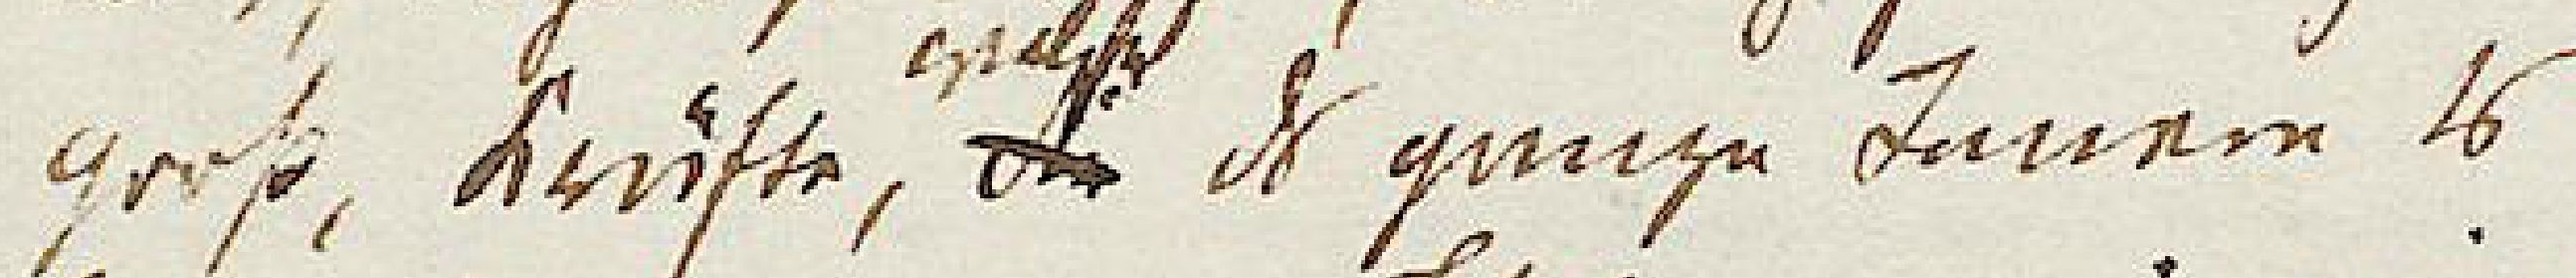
groß, Kräfte, die ds ganze Innere 1s
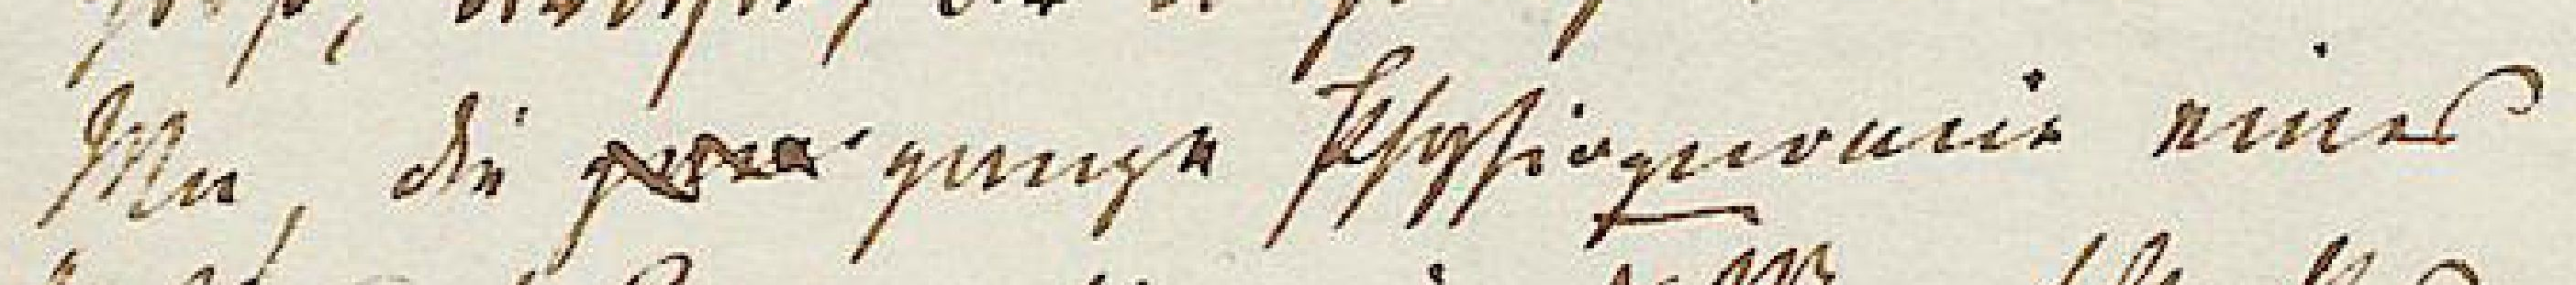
Mn, die ganz ganze Psgtiogeonie eines
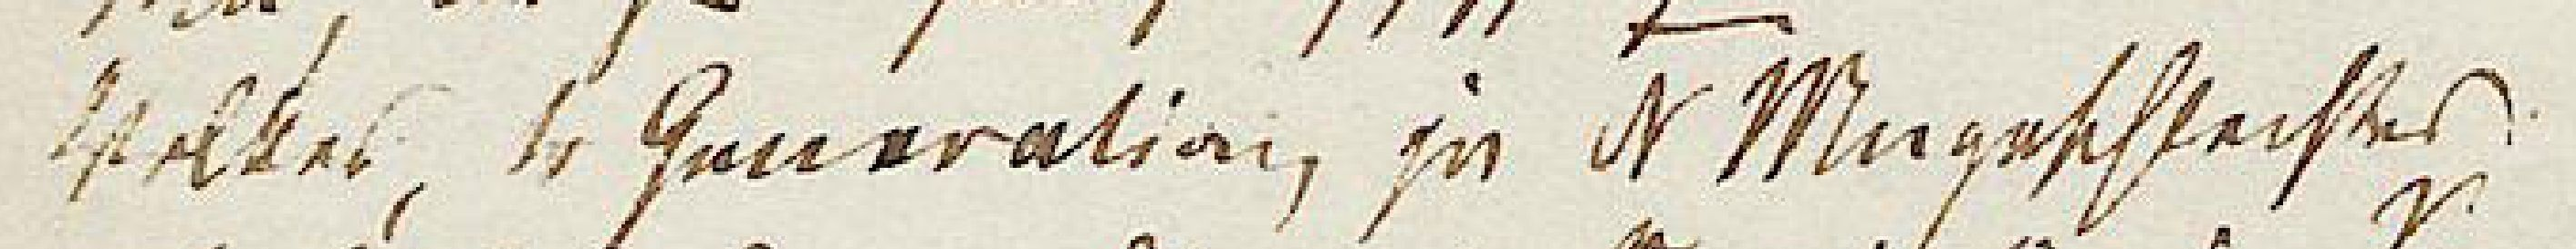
Volkes, 1r Generation, ja Mngeschlechtes
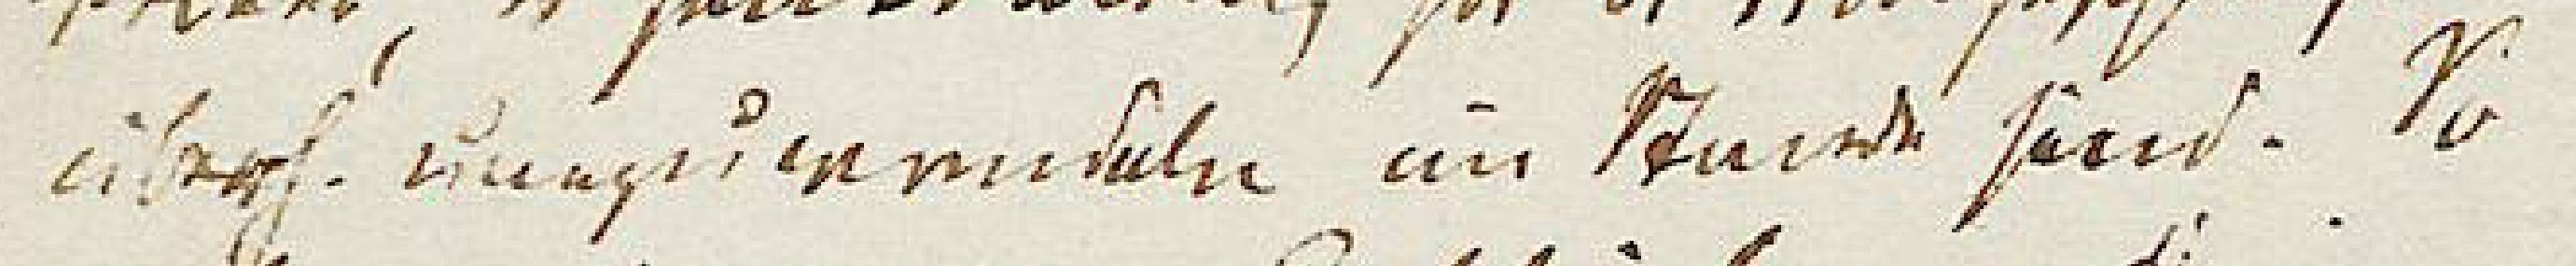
überh. umzuwandeln im Stande sind. So
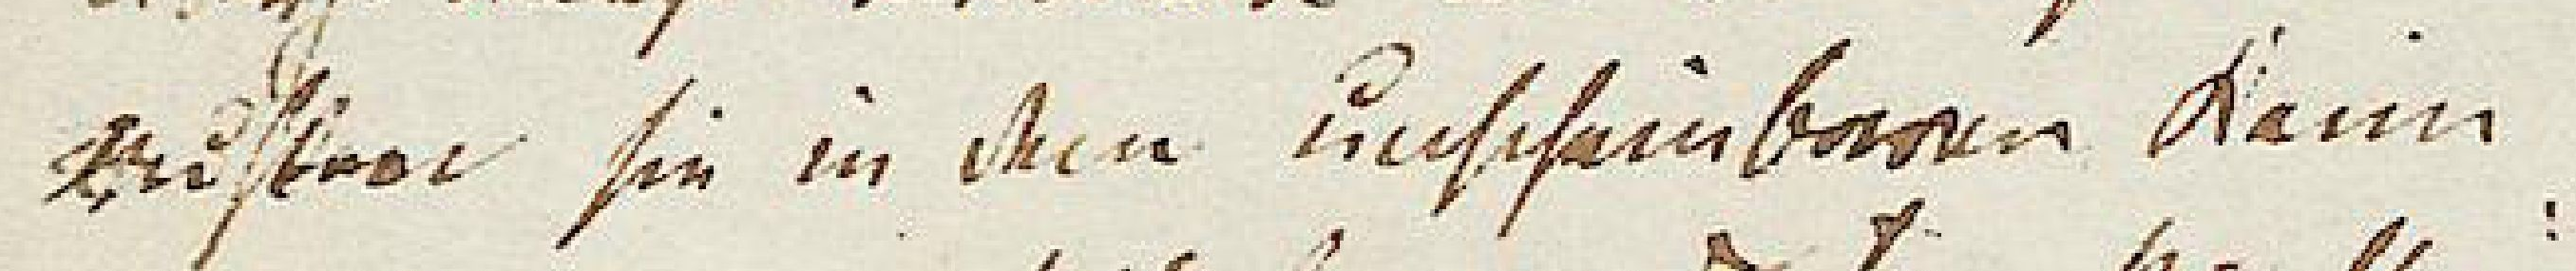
ruhten sie in dem unscheinbaren Keim
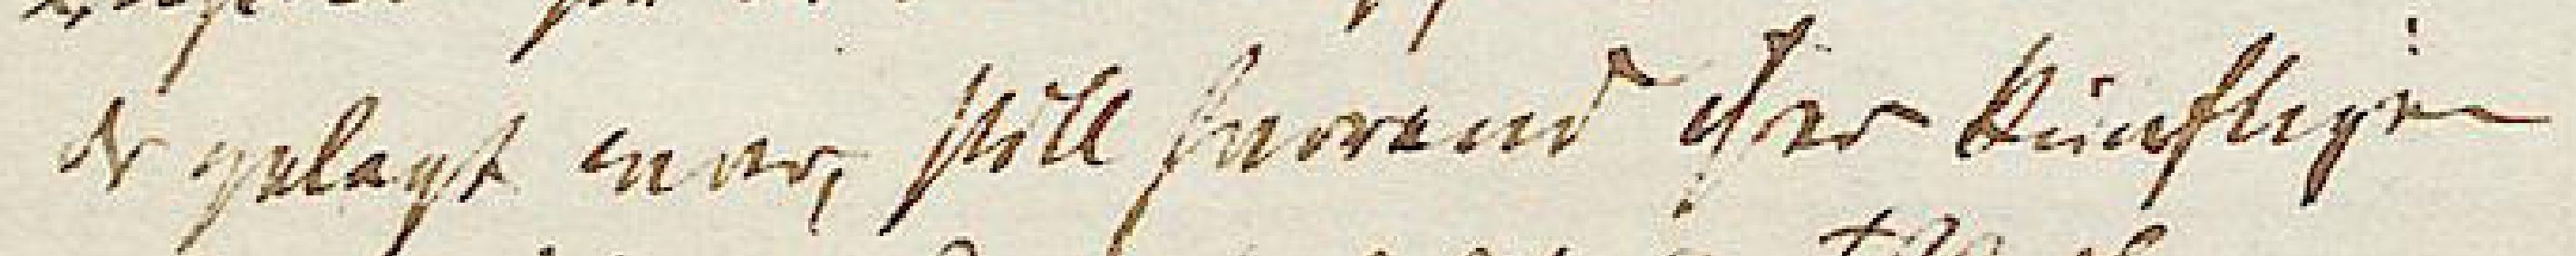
dr gelegt war, still harrend ihrer künftigen
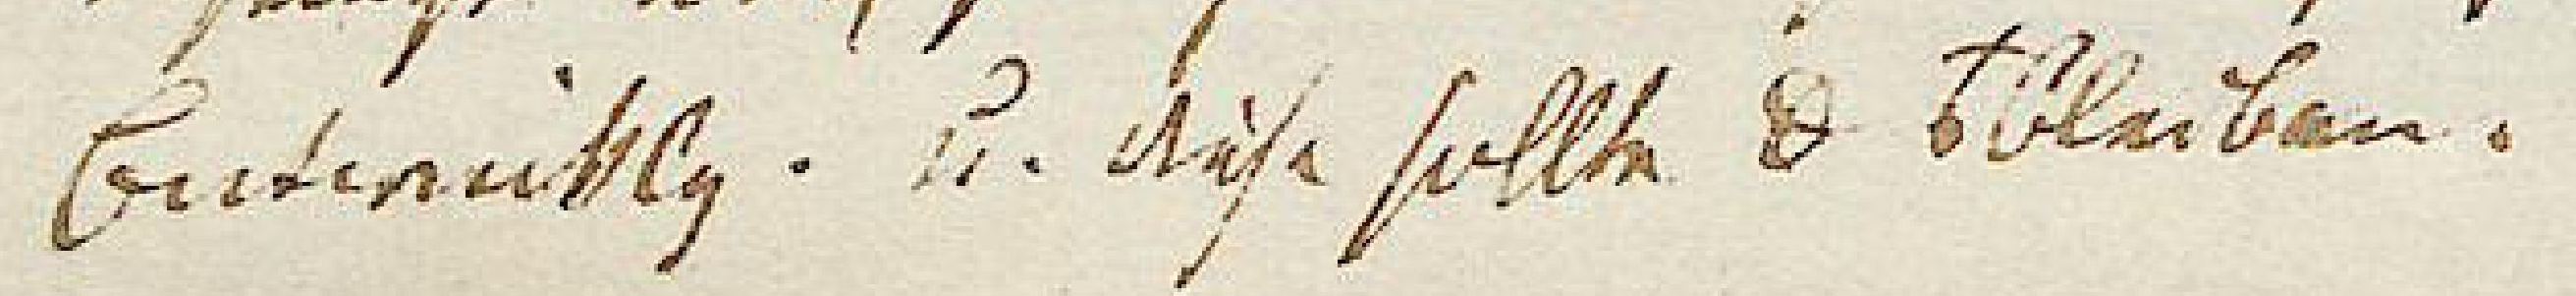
Entwicklg. u. diese sollte o sbleiben.
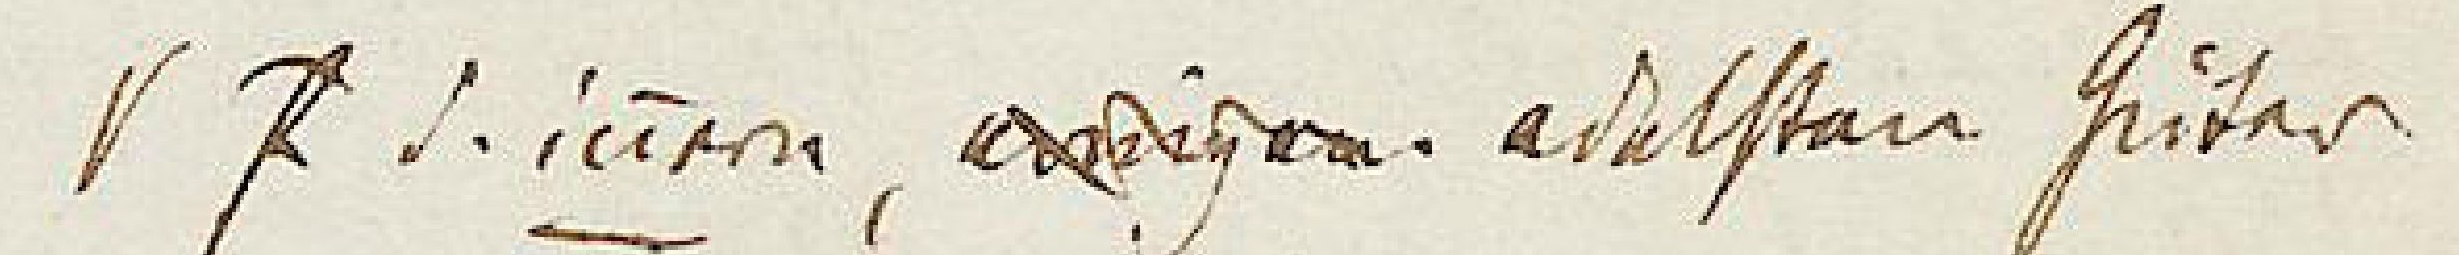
V f d inere, ewigen edelsten Güter
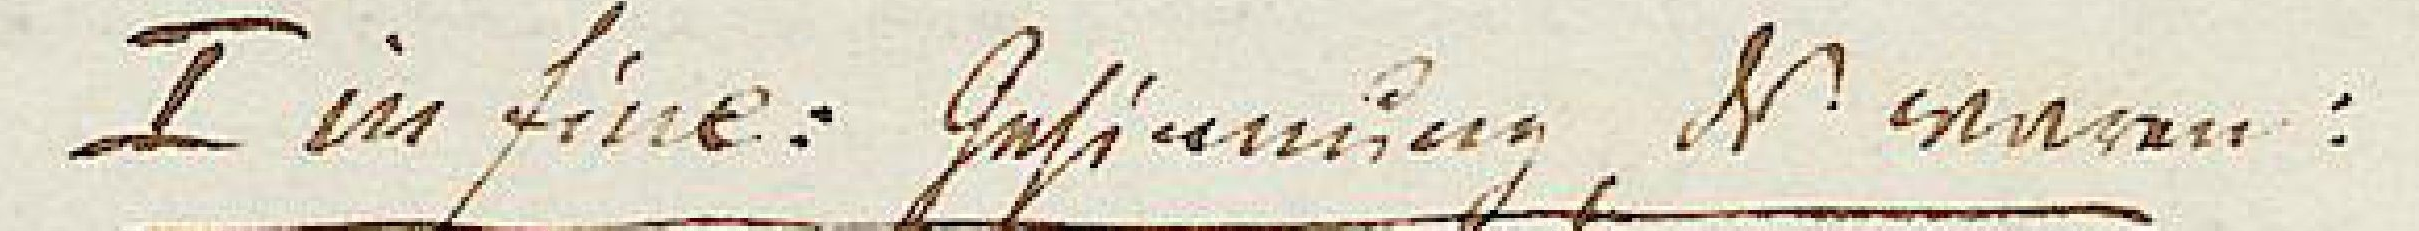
I in fine: Gesinnung, ds waren:
